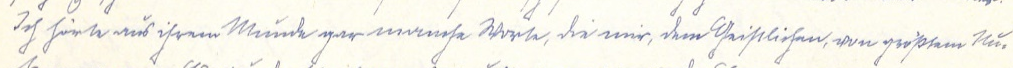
Ich hörte aus ihrem MUnde gar manche Worte, die mir, dem Geistlichen, von größtem Nu-
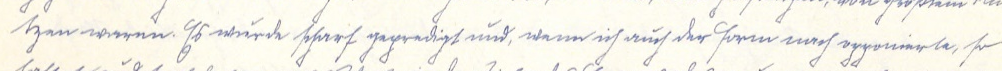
tzen waren. Es wurde scharf gepredigt und, wenn ich auch der Form nach opponierte, so
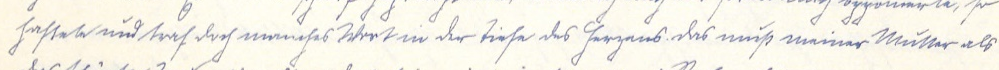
haftete und traf doch manches Wort in der Tiefe des Herzenzs. Das muß meiner Mutter als
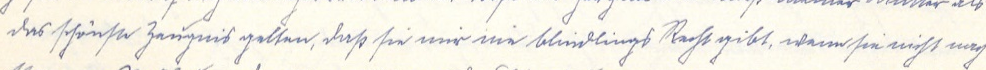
das schönste Zeugnis gelten, daß sie mir nie blindlings Recht gibt, wenn sie nicht nach
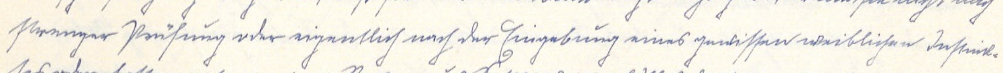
strenger Prüfung oder eigentlich nach der Eingebung eines gewissen weiblichen Instink-
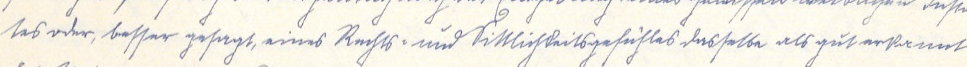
tes oder, besser gesagt, eines Rechts- und Sittlichkeitsgefühles dasselbe als gut anerkannt
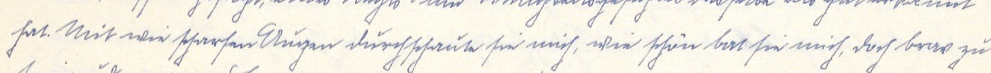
hat. Mit wie scharfen Augen durchschaute sie mich, wie schön bat sie mich, doch brav zu
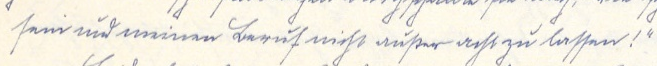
sein und meinen Beruf nicht außer Acht zu lassen!"
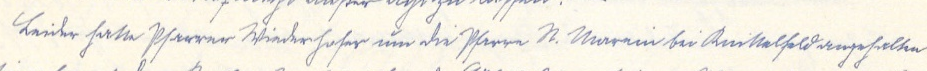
Leider hatte Pfarrer Wiederhofer um die Pfarre St. Marien bei Knittelfeld angesucht
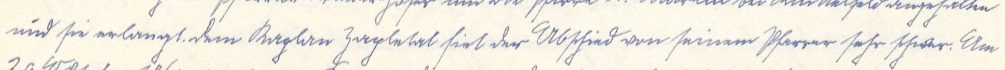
und sie erlangt. Dem Kaplan Zapletat fiel der Abschied von seinem Pfarrer sehr schwer. Am
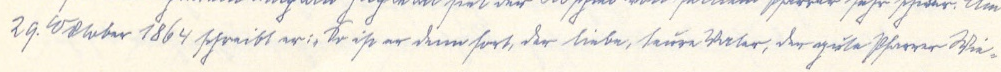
29. Oktober 1864 spricht er: "So ist er denn fort, der liebe, teure Vater, der gute Pfarrer Wie-
